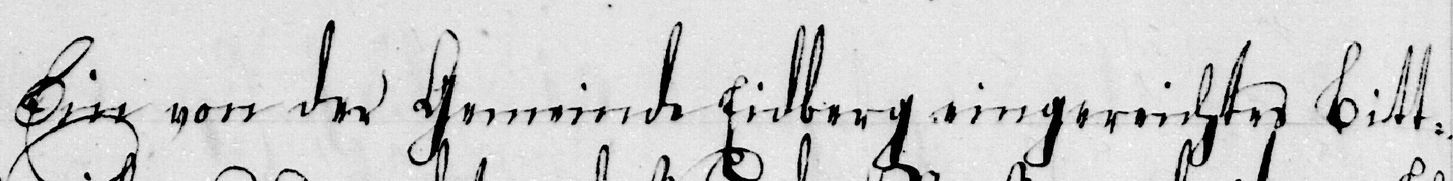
Ein von der Gemeinde Eidberg eingereichtes Bitt¬
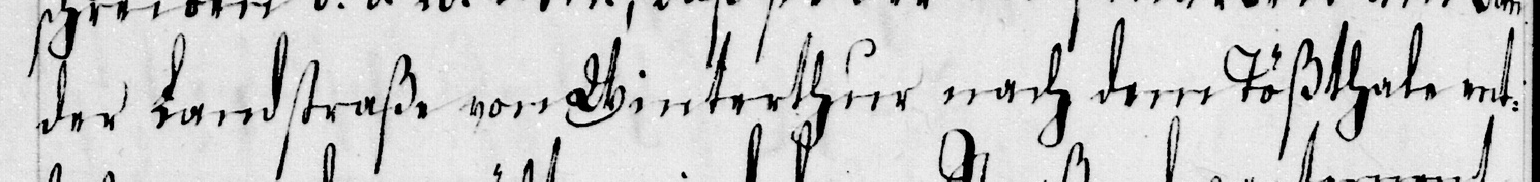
er Landstraße von Winterthur nach dem Tößthal ent¬
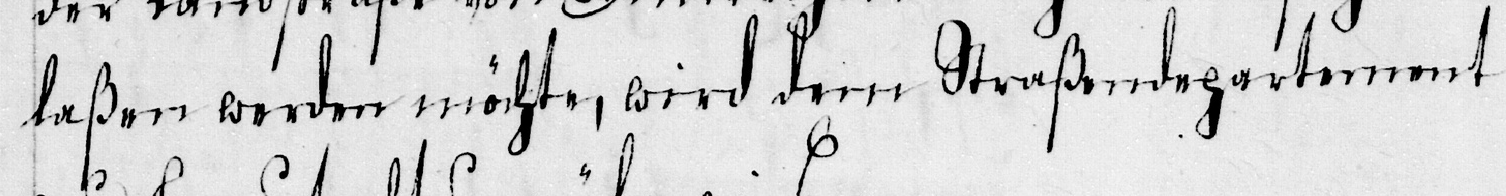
laßen werden möchte, wird dem Straßendepartement
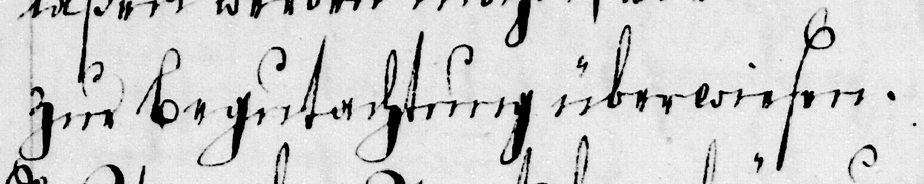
zur Begutachtung überwiesen.
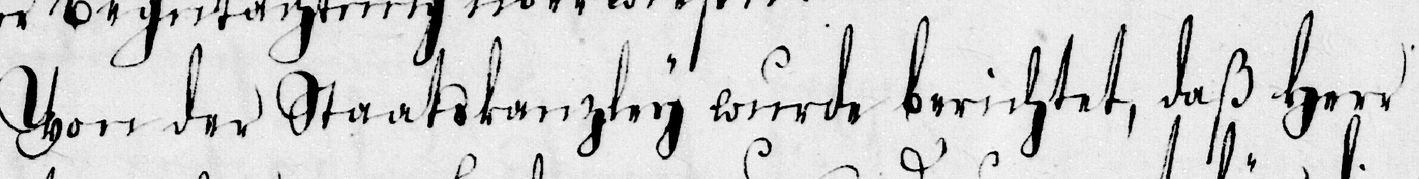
Von der Staatskanzley wurde berichtet, daß Herr
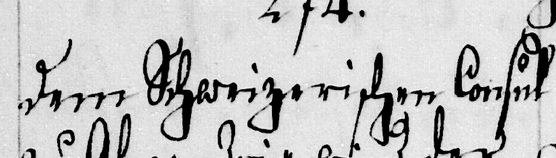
dem Schweizerischen Consul
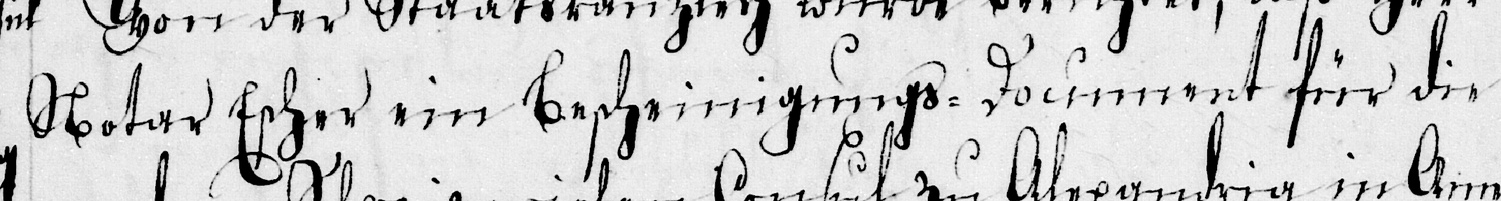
Notar Escher ein Bescheinigungs-Document für die
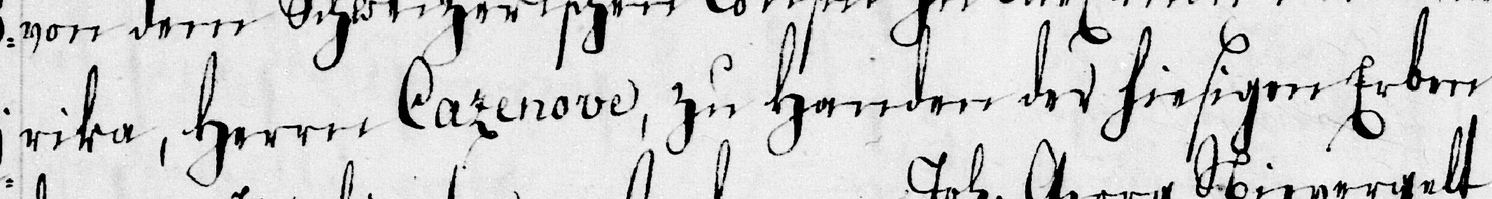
rika, Herrn Cazenove, zu Handen der hiesigen Erben
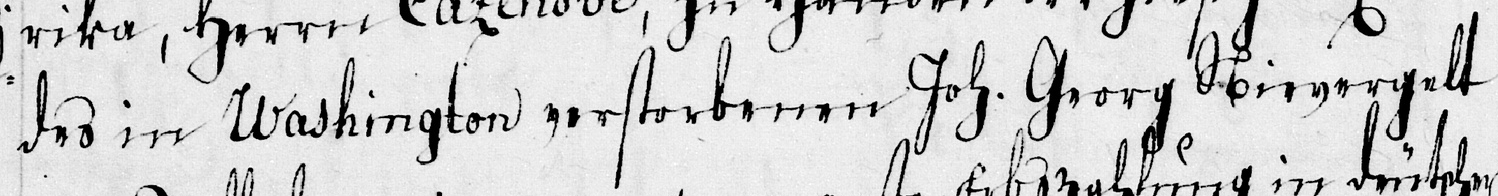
des in Washington verstorbenen Joh. Georg Nievergelt
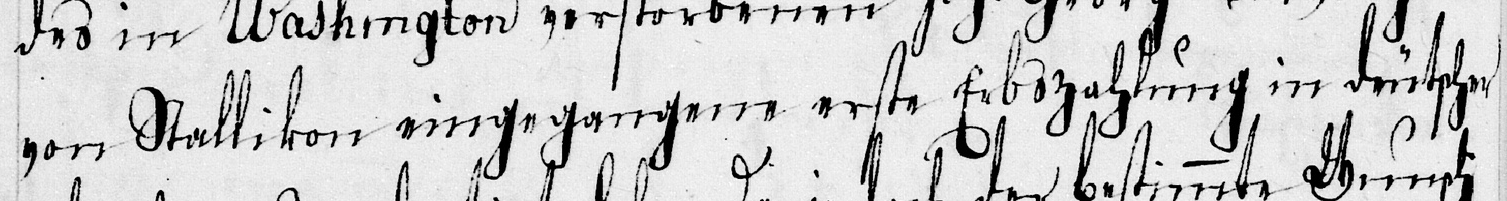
von Stallikon eingegangene erste Erbzahlung in deutscher
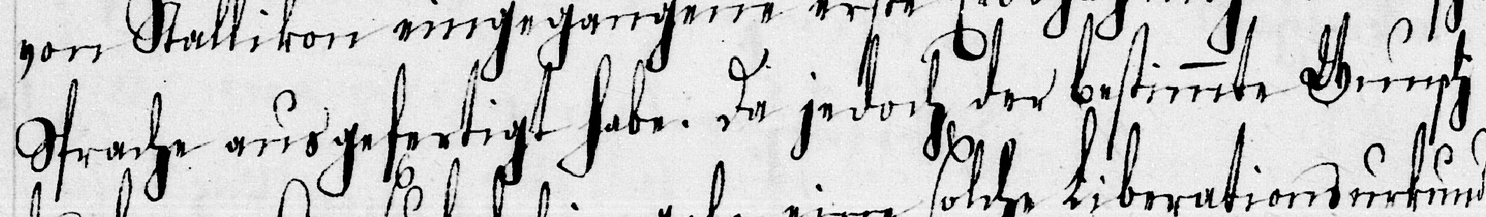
Sprache ausgefertigt habe. Da jedoch der bestimmte Wunsch
